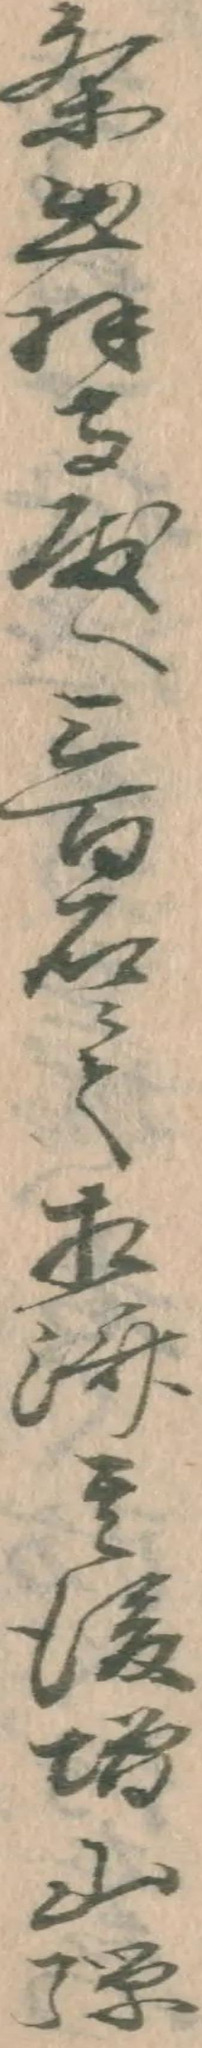条出羽守殿へ三百石にて相済其後増山弾
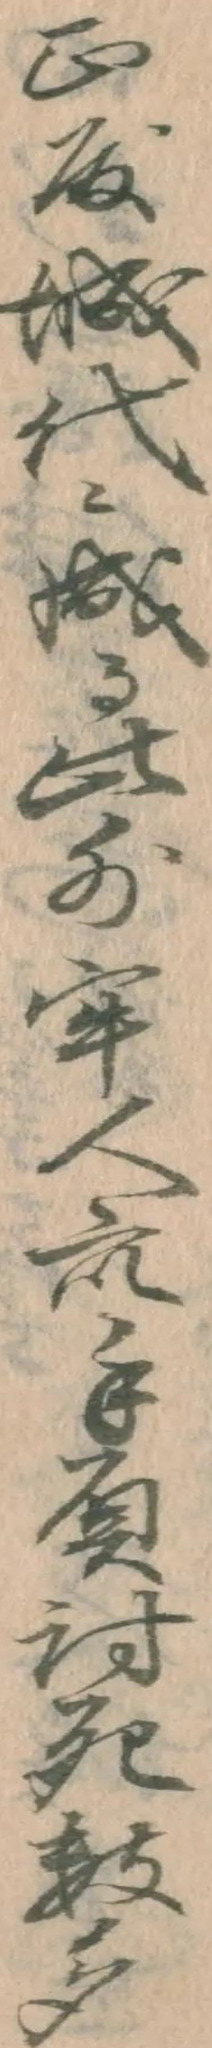正殿城代に成る此外牢人衆手負討死数多
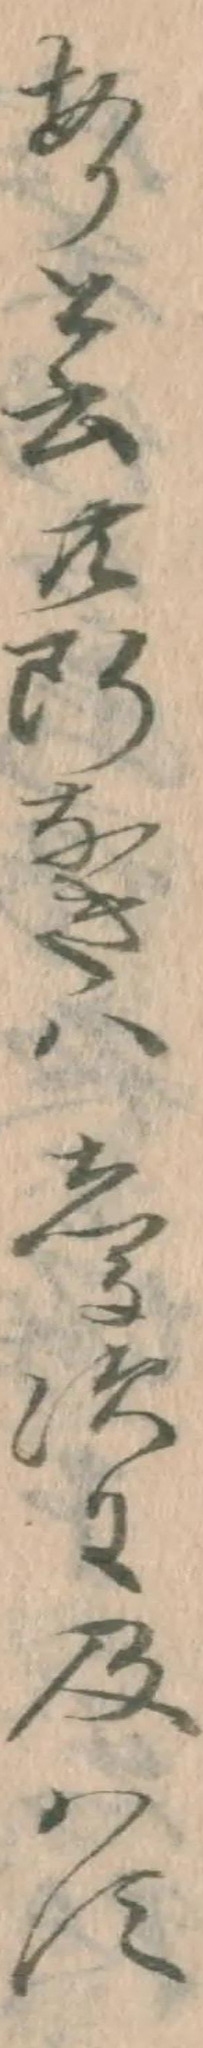ありと云共断なきは志る須尓及は須
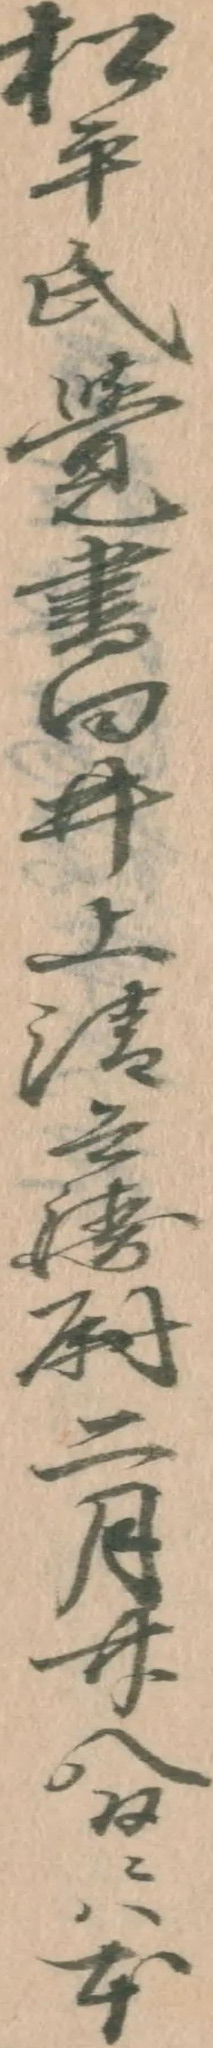松平氏覚書曰井上清兵衛尉二月廿八日には本
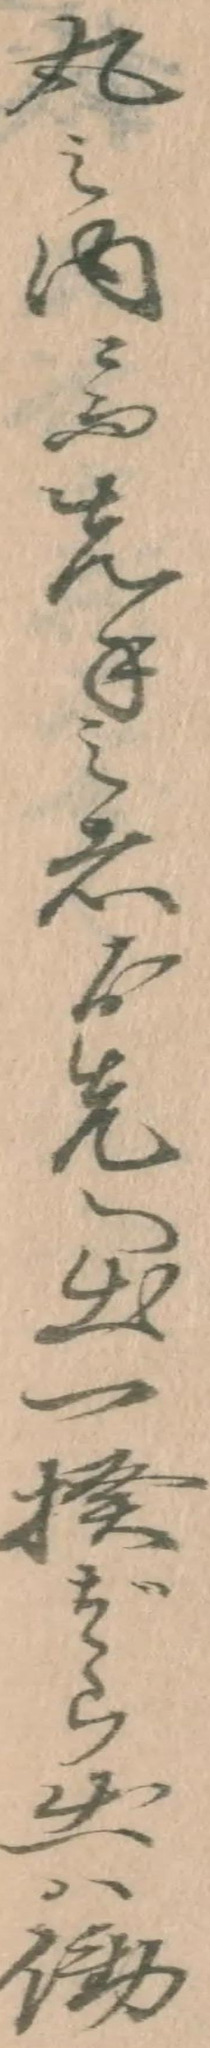丸之内に而先手之者ゟ先へ出一揆ばら出は働
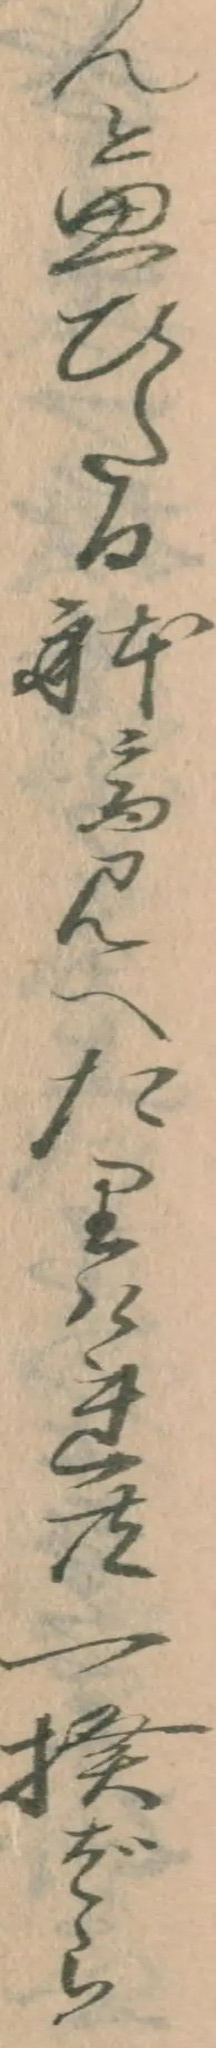んと思ひたる躰に而見へた里け連共一揆ばら
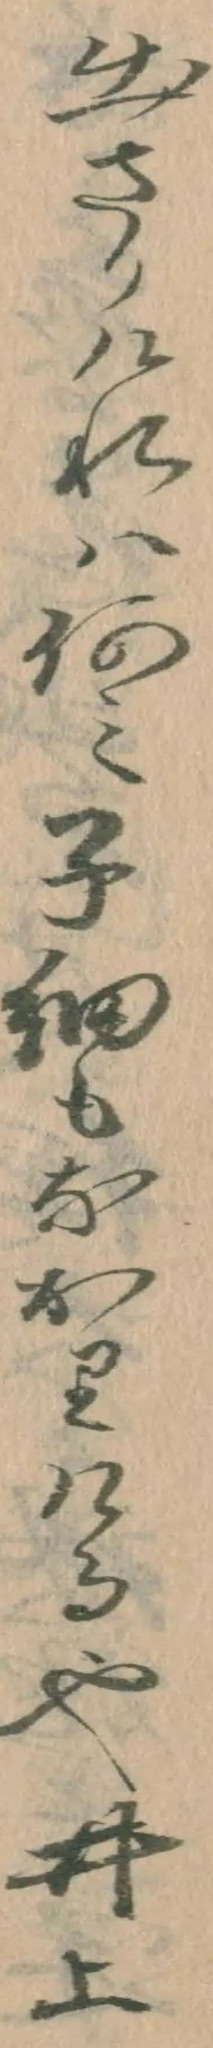出さりけれは何之子細もなか里けるや井上
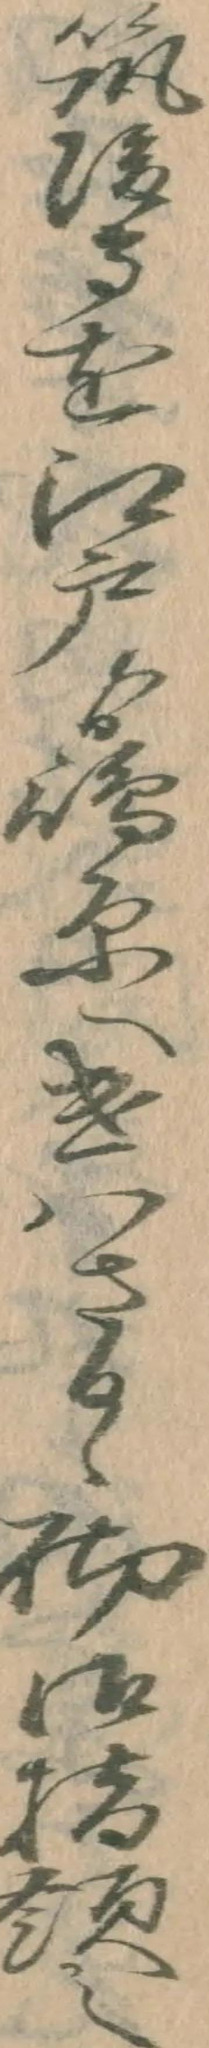筑後守を江戸ゟ島原へ遣はさるゝ砌御指領之
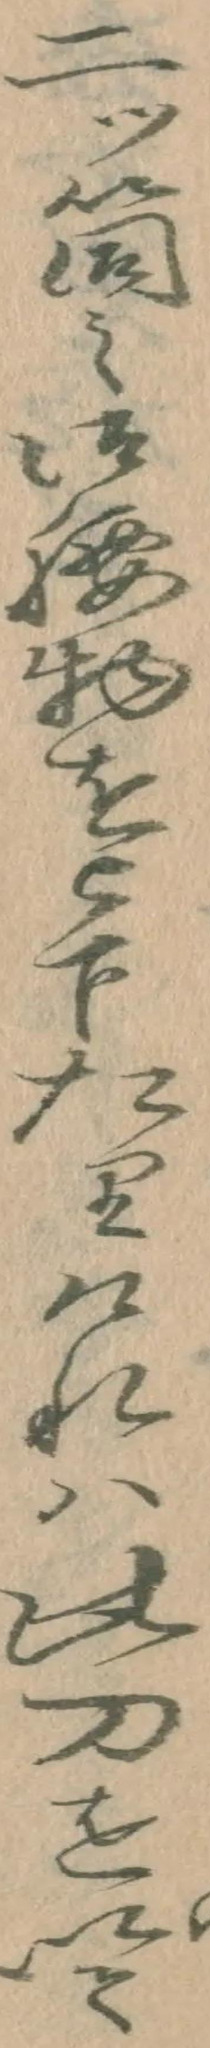二つ筒之御腰物を被下た里けれは此刀を以て
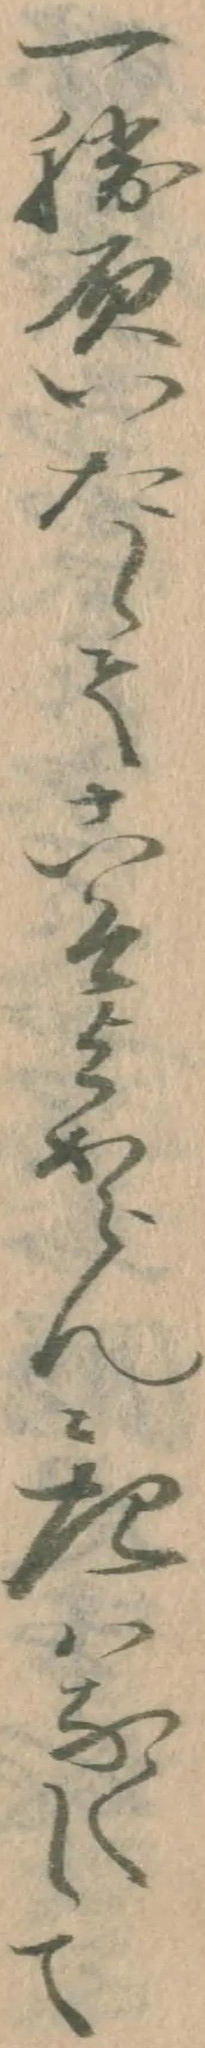一勝負いたして古そ与からんに左はなくして
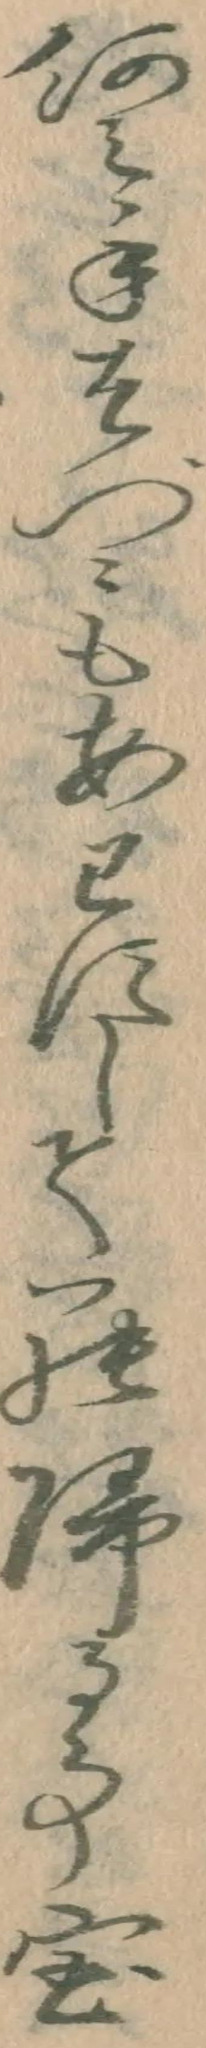何之手者づにもあ已須して罷帰る事宝
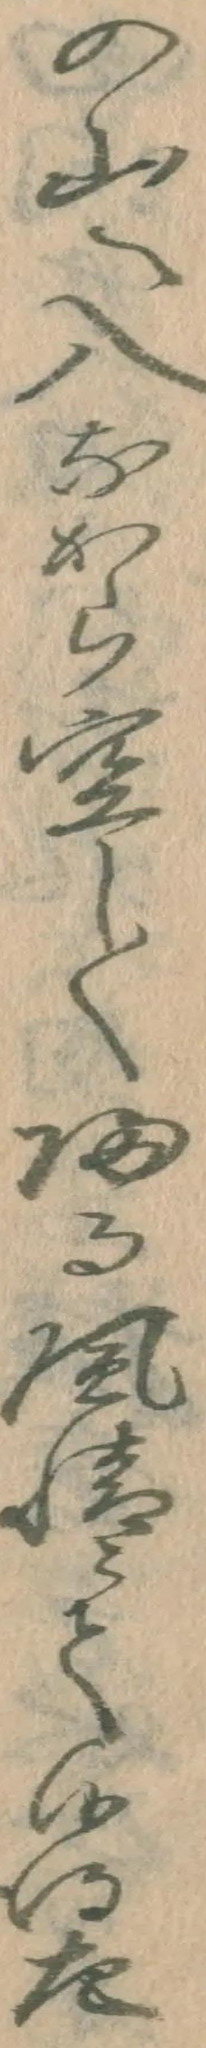の山へ入なから空しく帰る風情にて候得左
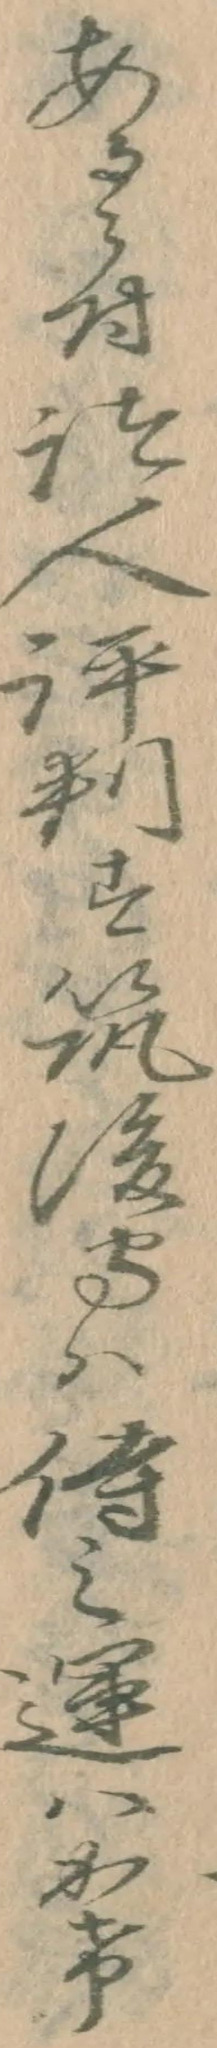あるに付諸人評判春筑後守は侍之運は加希
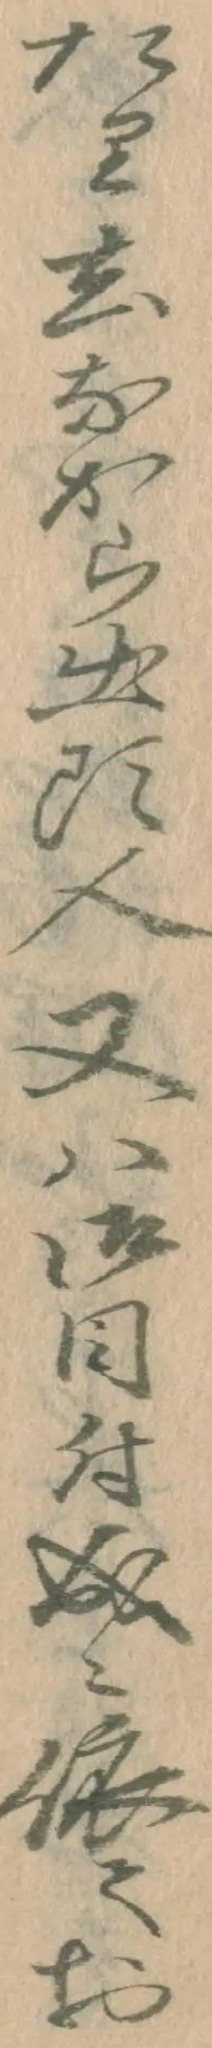た里去なから出頭人又は御目付成に依てお
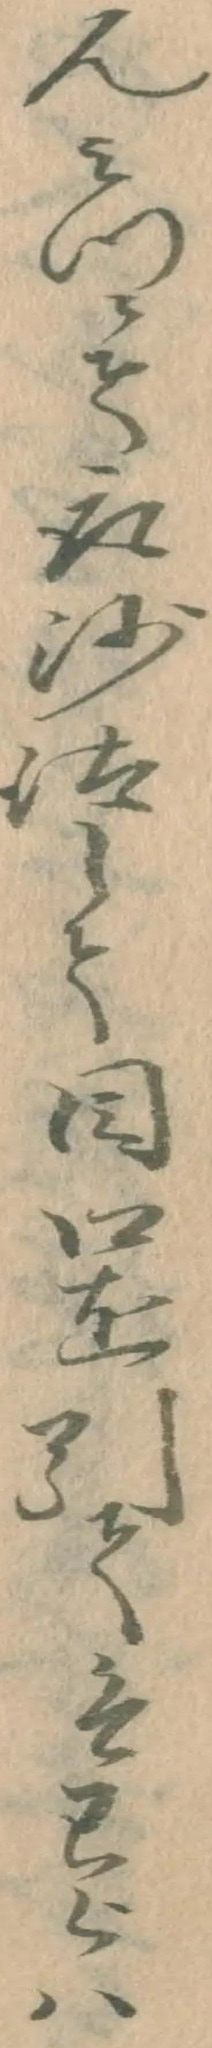ん与川にて取沙汰して目口を引てそ已らは

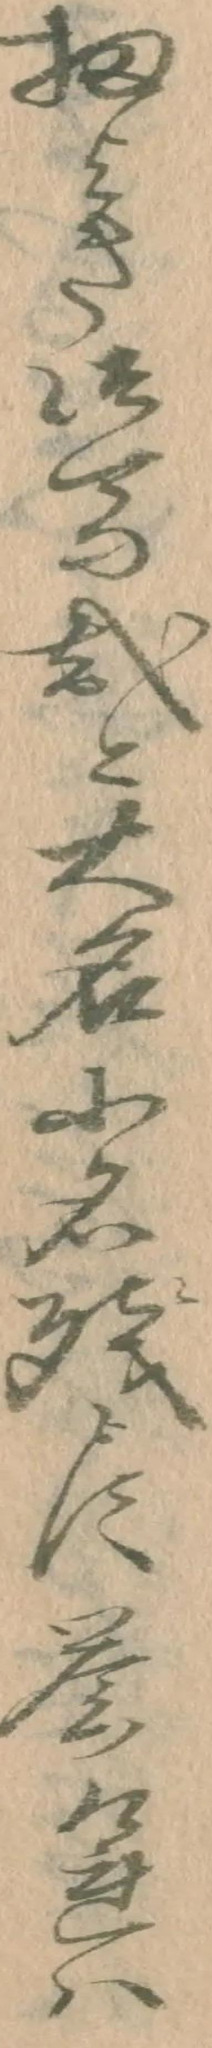扨与き御馬哉と大名小名残ら須誉け連は
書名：切支丹御退治記 49巻. [8]
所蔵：国立国会図書館 National Diet Library, JAPAN
